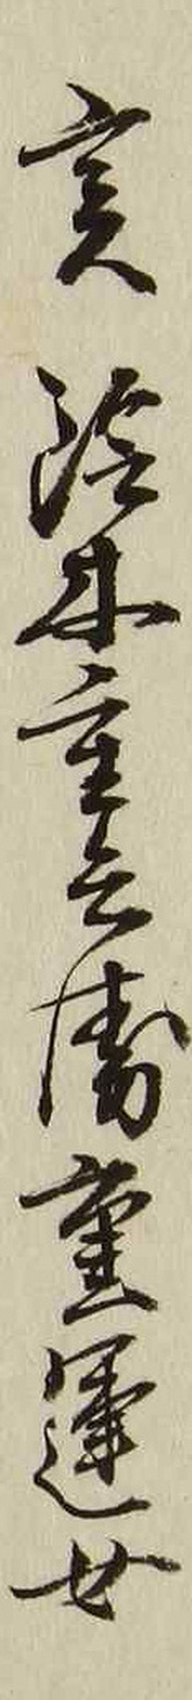実鈴木重兵衛重運女
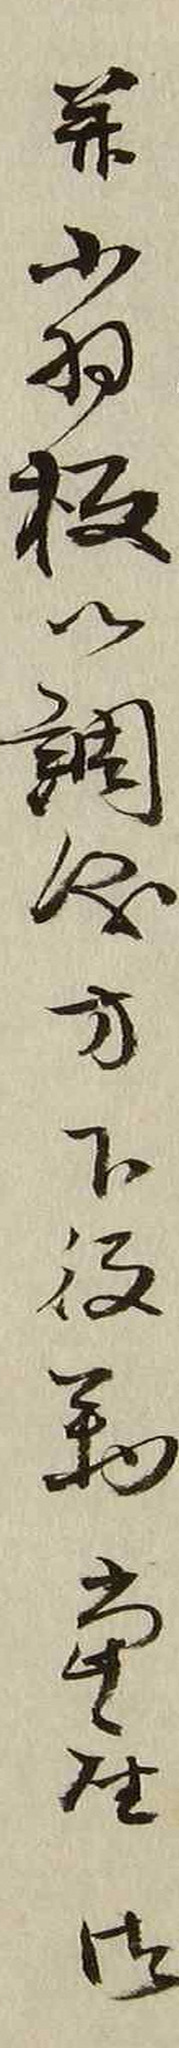并小羽板御調儀方下役勤当座御
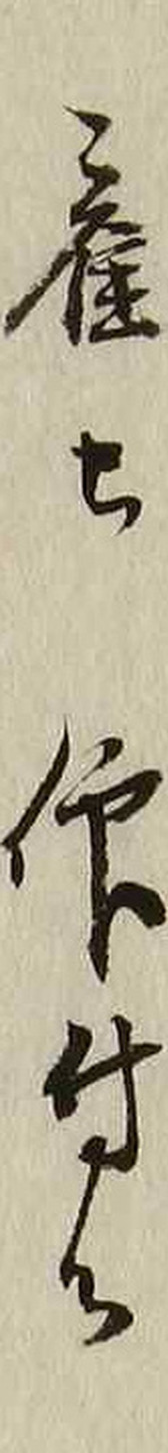雇被仰付候
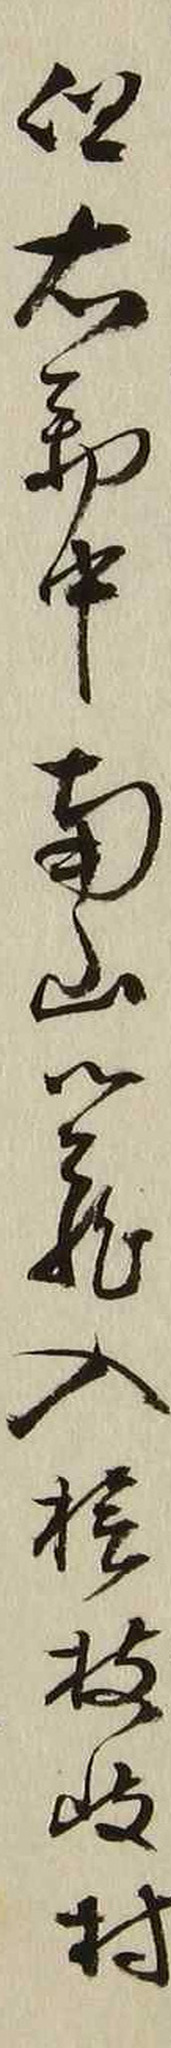但右勤中南山御蔵入桧枝岐村
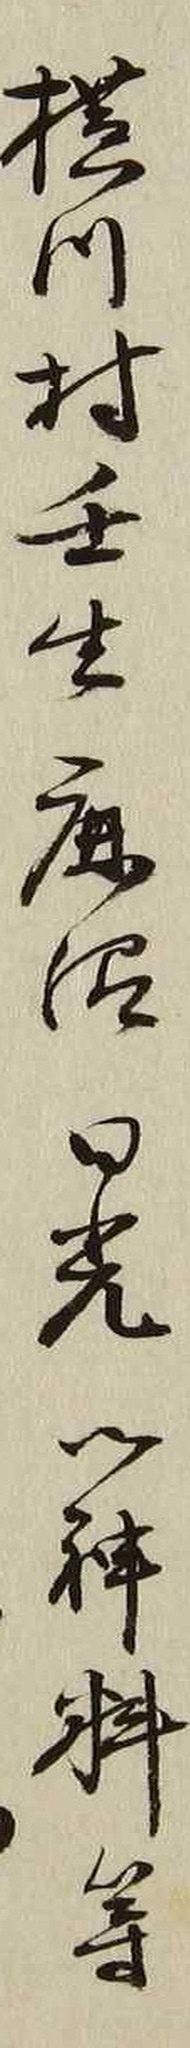横川村壬生鹿沼日光御神料等
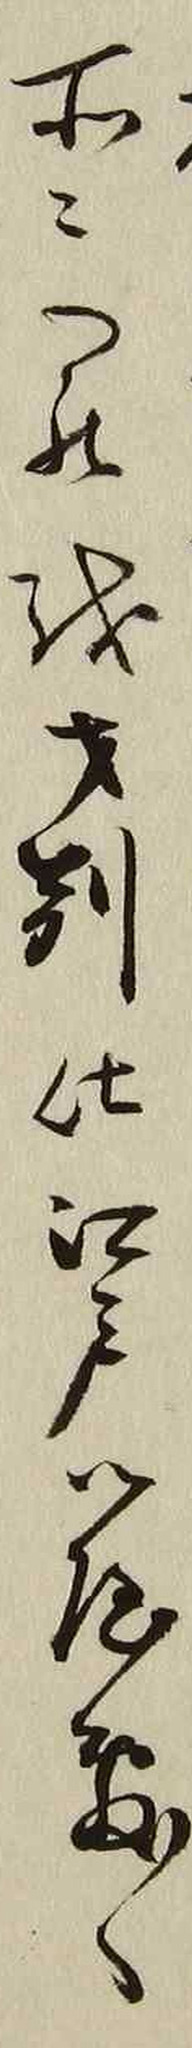所々罷越才判仕江戸御屋敷へ
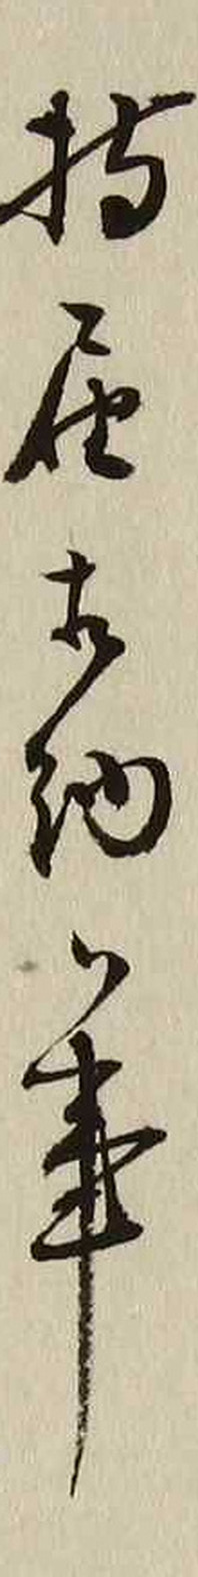持届相納候事
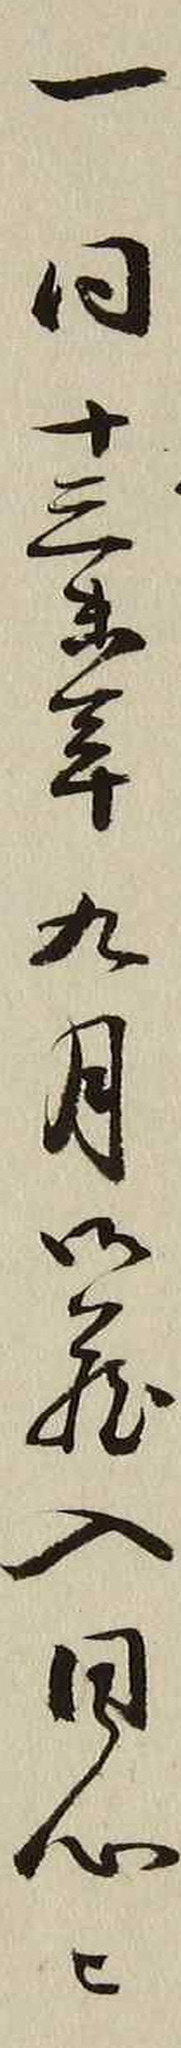一同十三未年九月御蔵入同心被
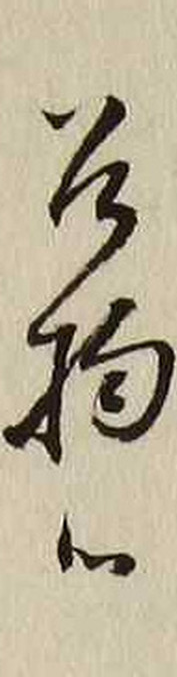召抱候
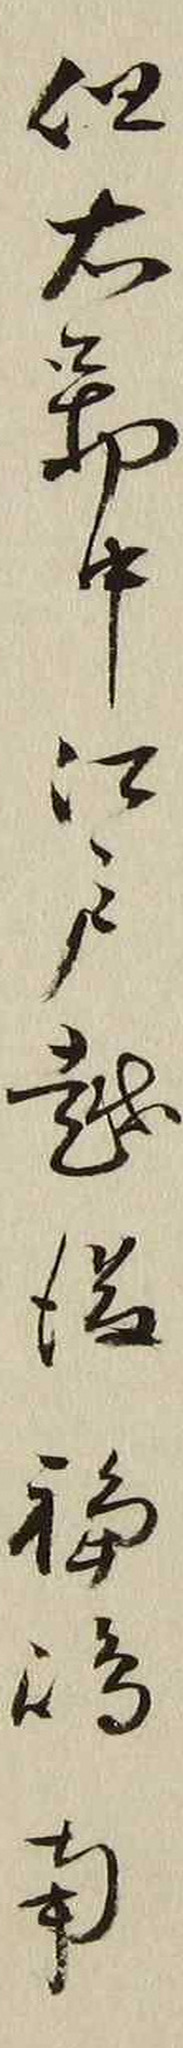但右勤中江戸越後福島南
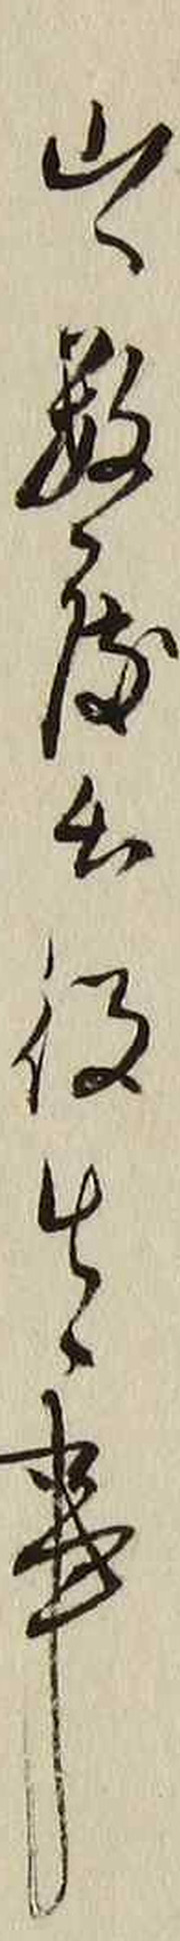山へ数度出役仕候事
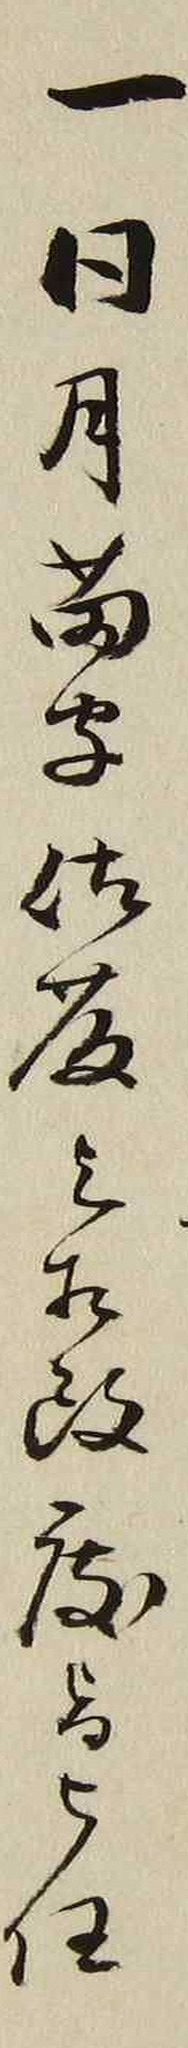一同月苗字佐藤与相改度旨被任
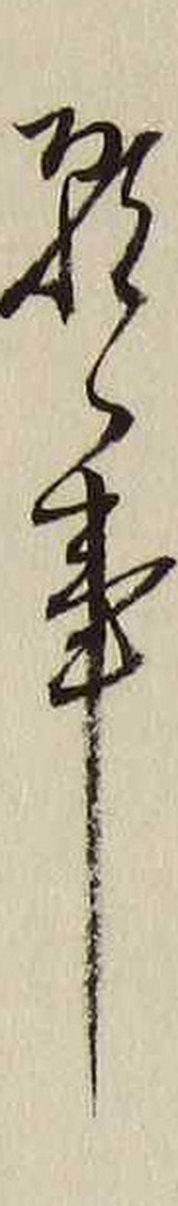願候事
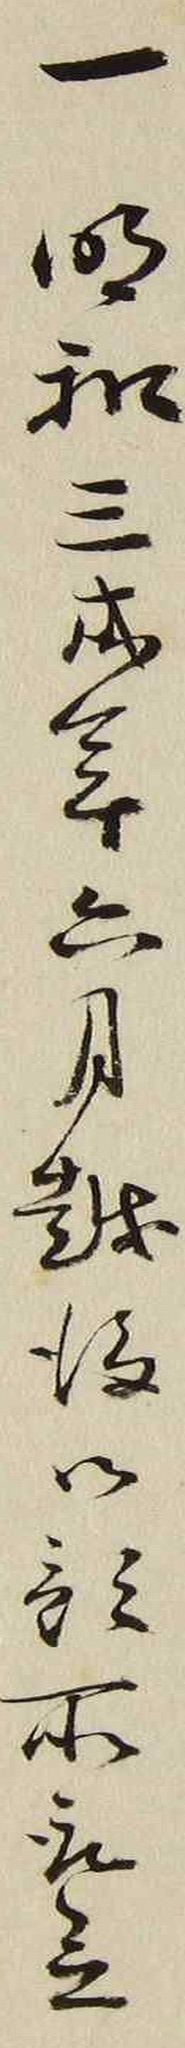一明和三戌年六月越後御預所取立
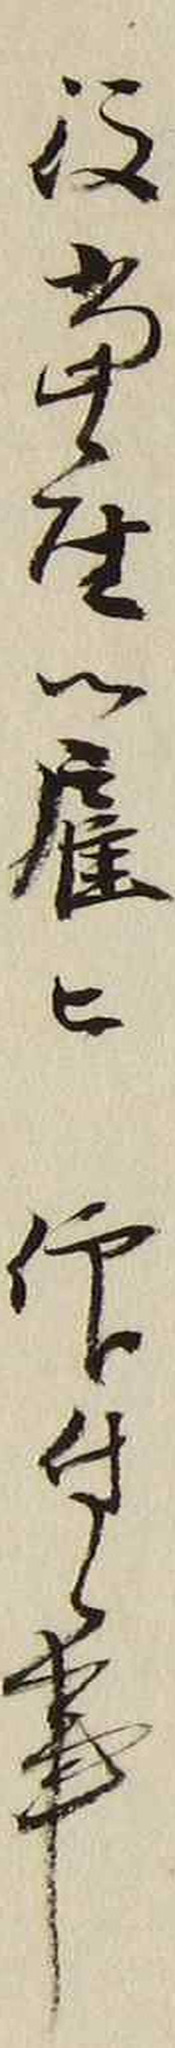役当座御雇被仰付候事
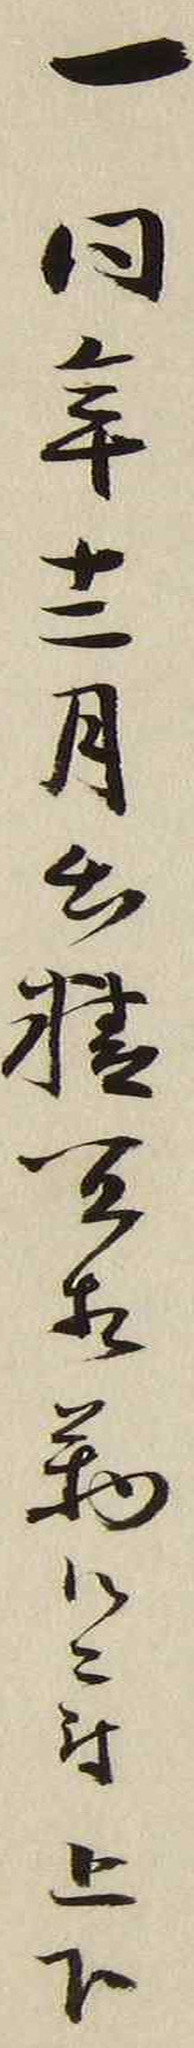一同年十二月出精宜相勤候ニ付上下
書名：諸士系譜　巻之291　さ之部23
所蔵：会津若松市立会津図書館
